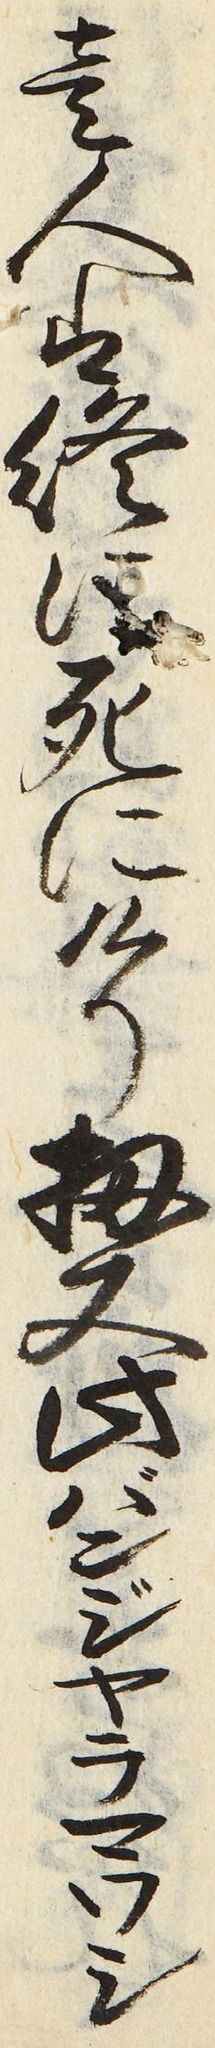壱人は終に死にけり扨又此バンジヤラマワシ
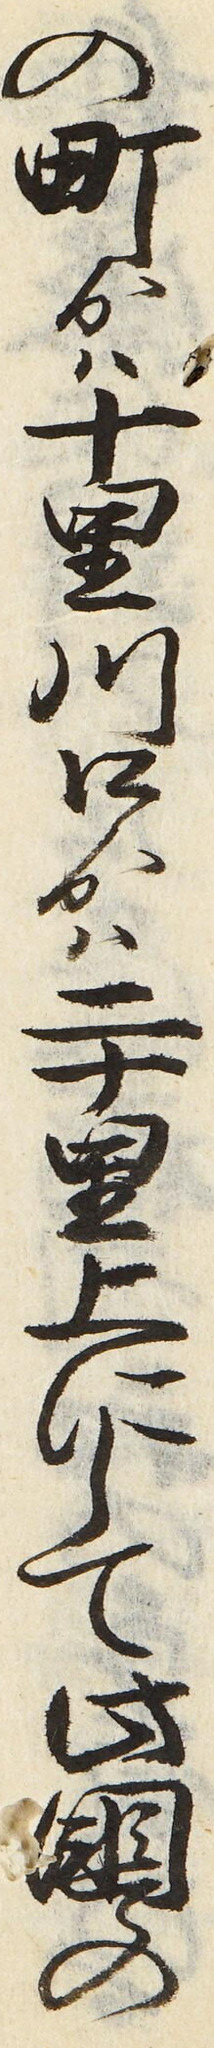の町ゟは十里川口ゟは二十里上にして此国の
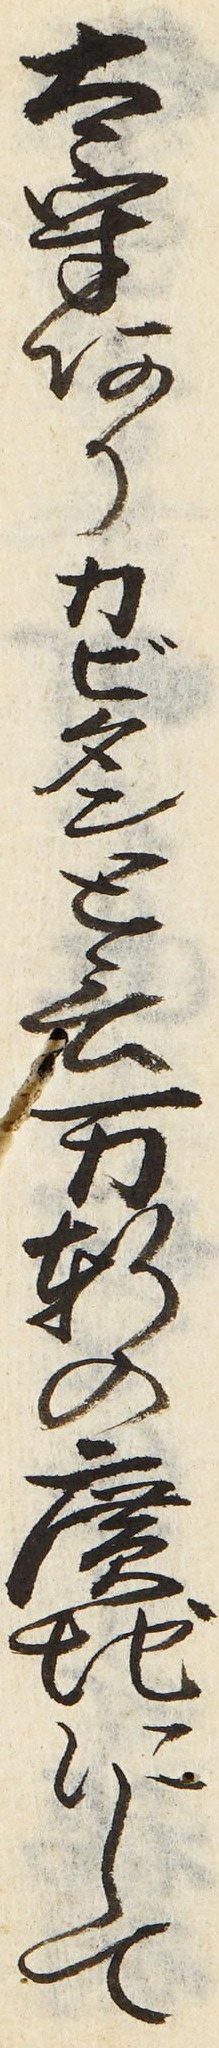太守ありカビタンと云万軒の広地にして
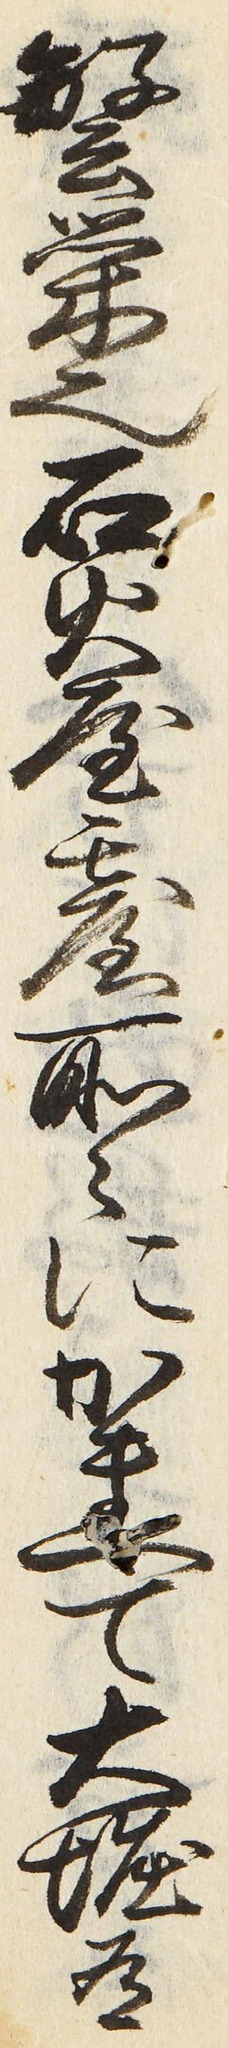繁栄也石火屋台所々にかまへて大堀有
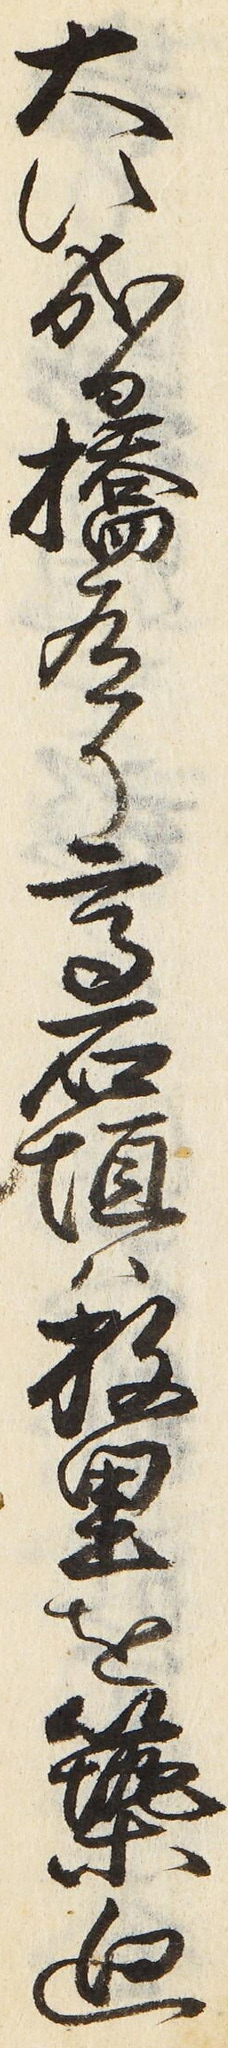大ひ成る橋有り高石垣は数里を築廻
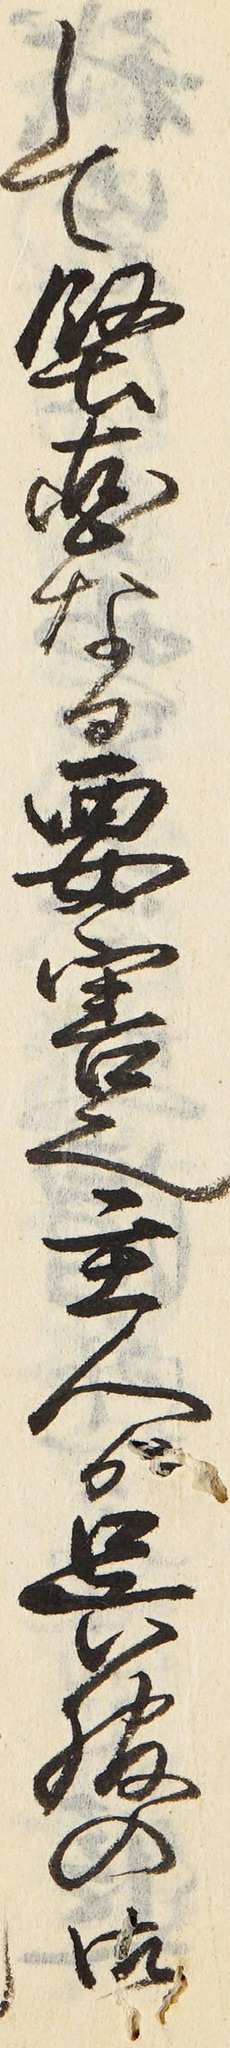して堅固なる要害也主人ゟ呉服の御
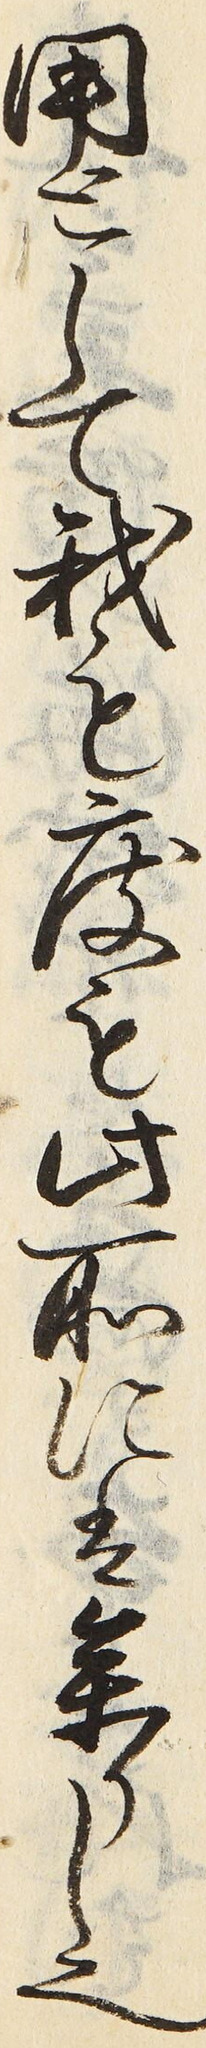用として我も度も此所には参りし也
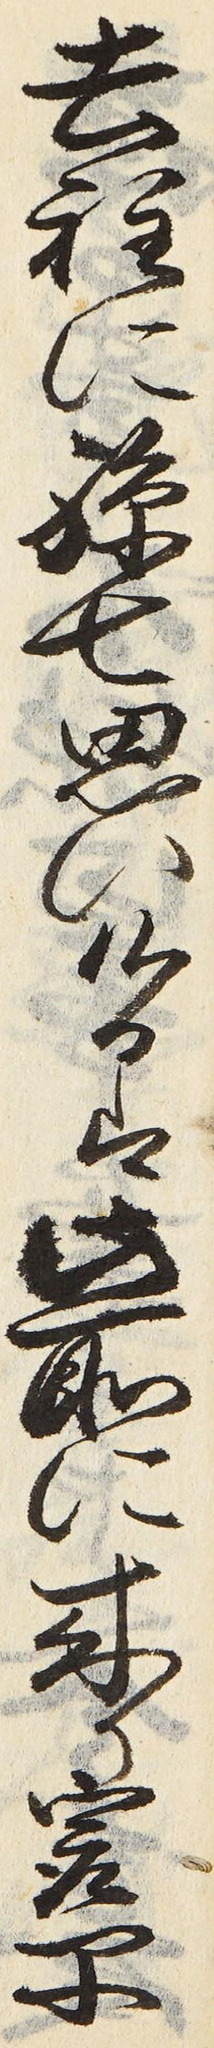去程に孫七思ひけるは此所に来り最早
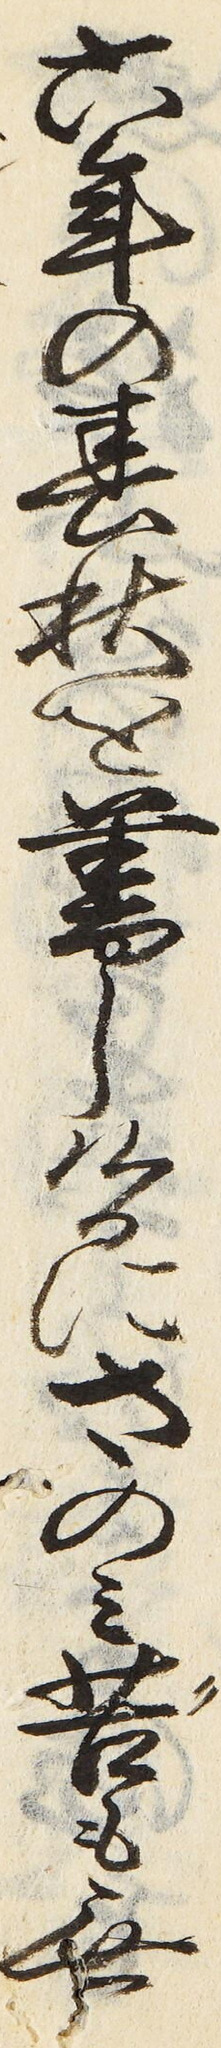六年の春秋を暮しけるにさのみ苦も無
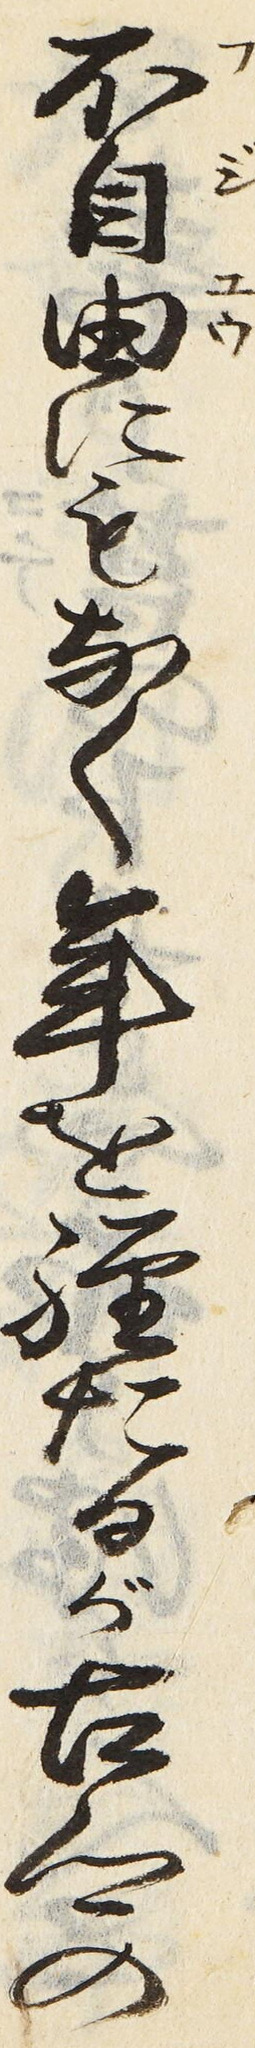不自由にもなく年を経たるが古郷の
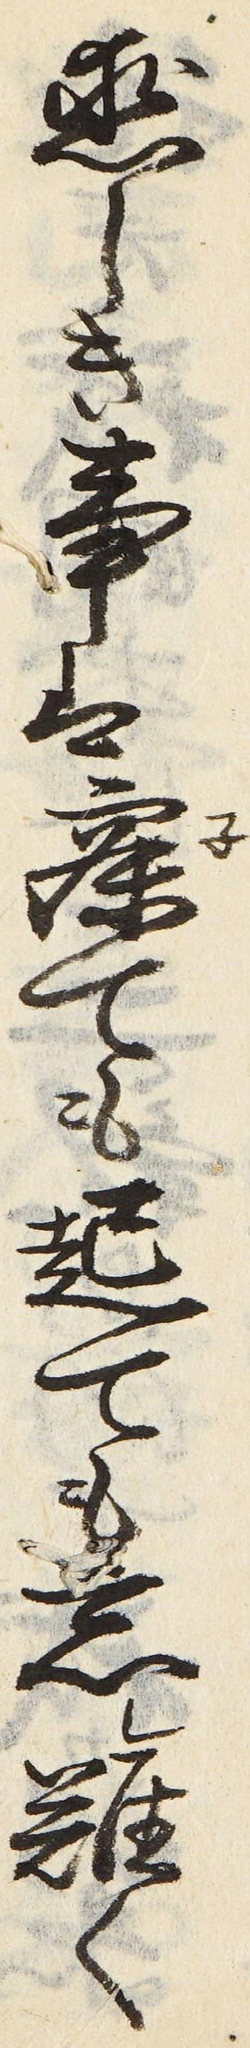恋しき事は寝ても起ても忘れ難く
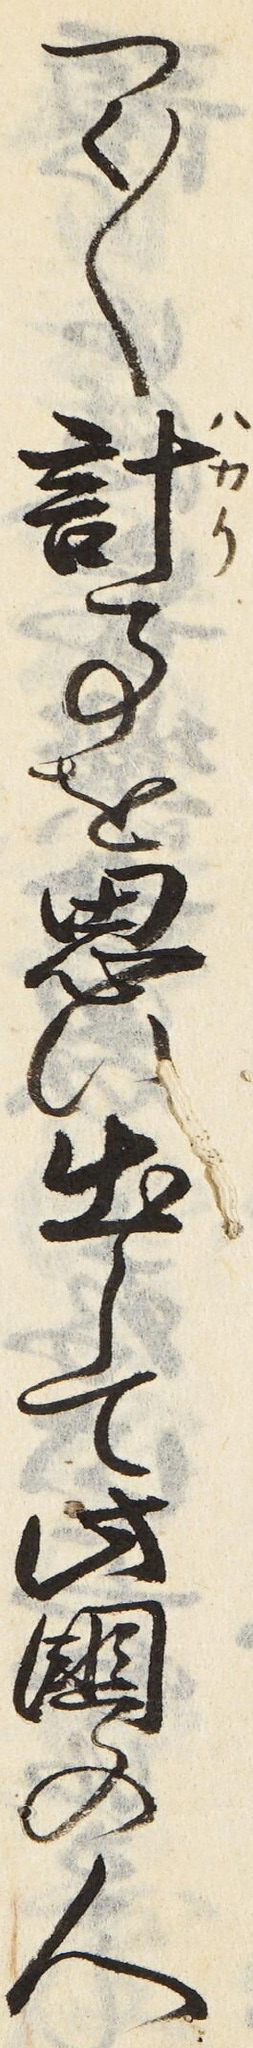つく〳〵計事を思ひ出して此国の人
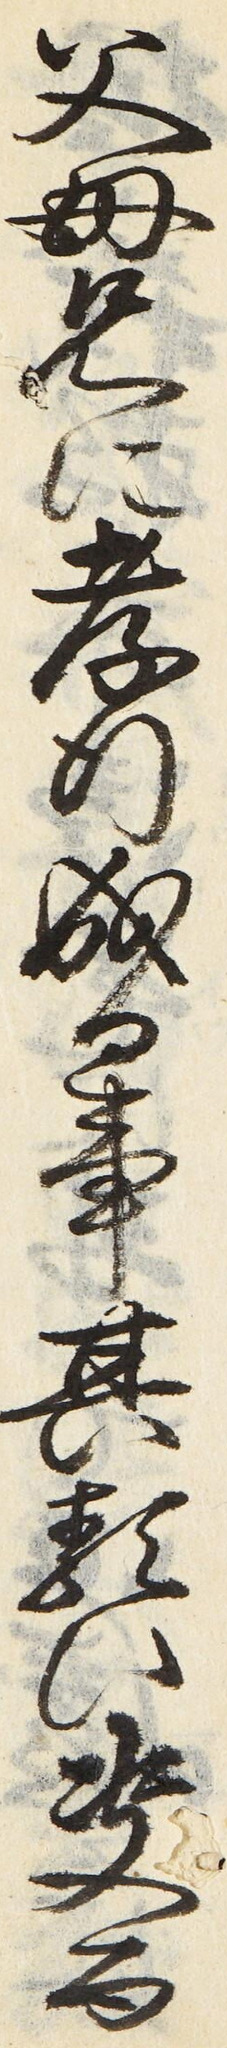父母兄に孝行成る事其類ひ決而
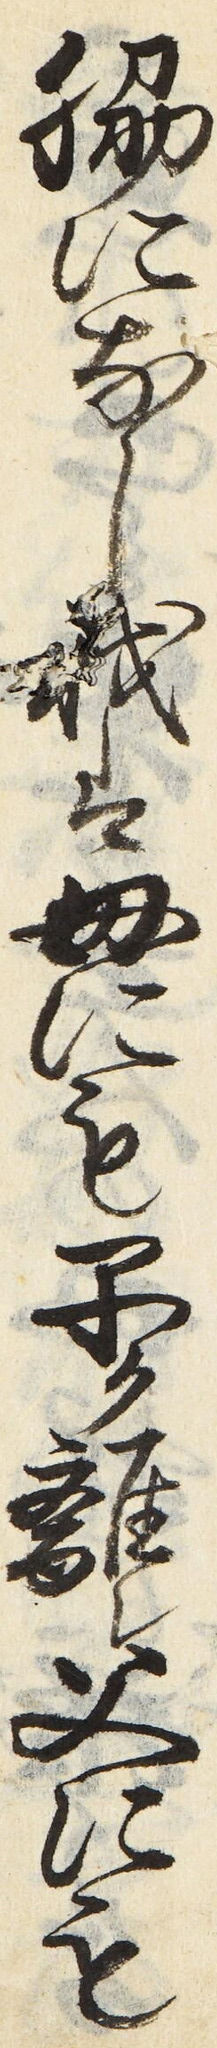脇になし我は母にも早く離れ父にも
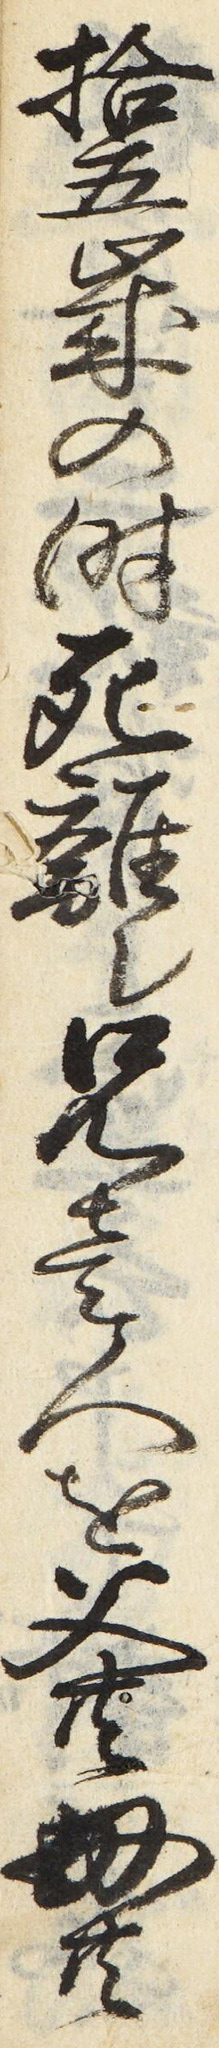拾五歳の時死離れ兄壱人を父共母共

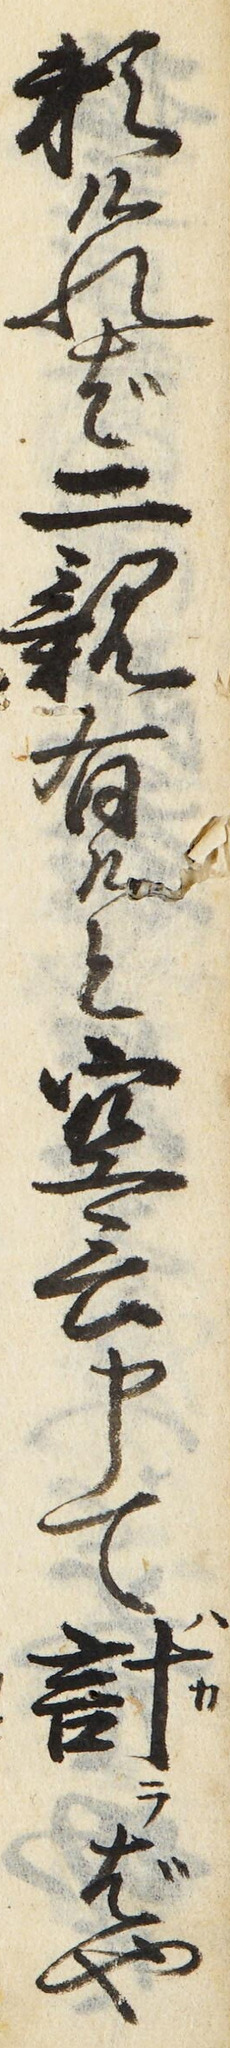頼ければ二親有ると空言申て計らばや
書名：華夷九年録
